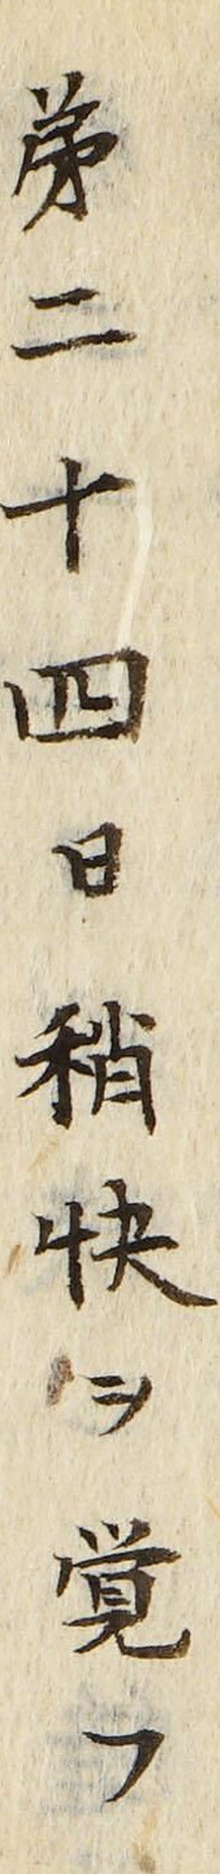第二十四日稍快ヲ覚フ
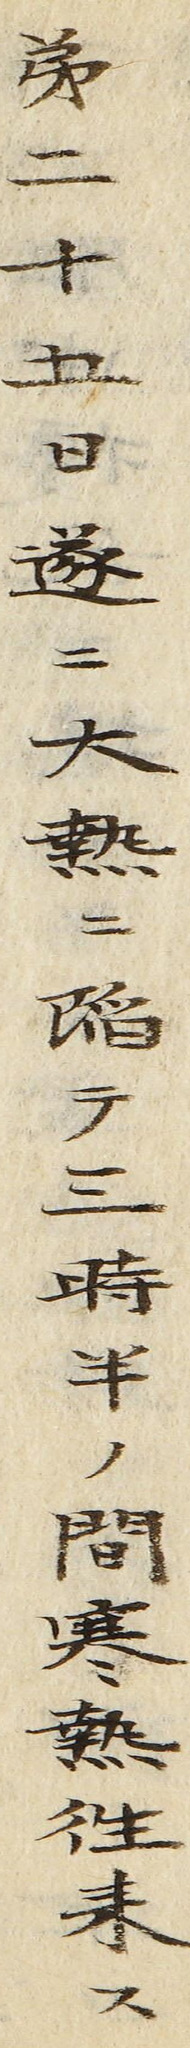第二十五日遂ニ大熱ニ陥テ三時半ノ間寒熱往来ス
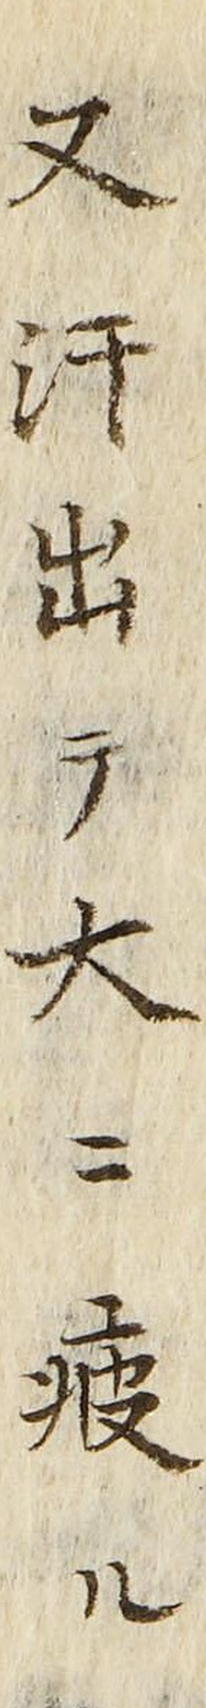又汗出テ大ニ疲ル
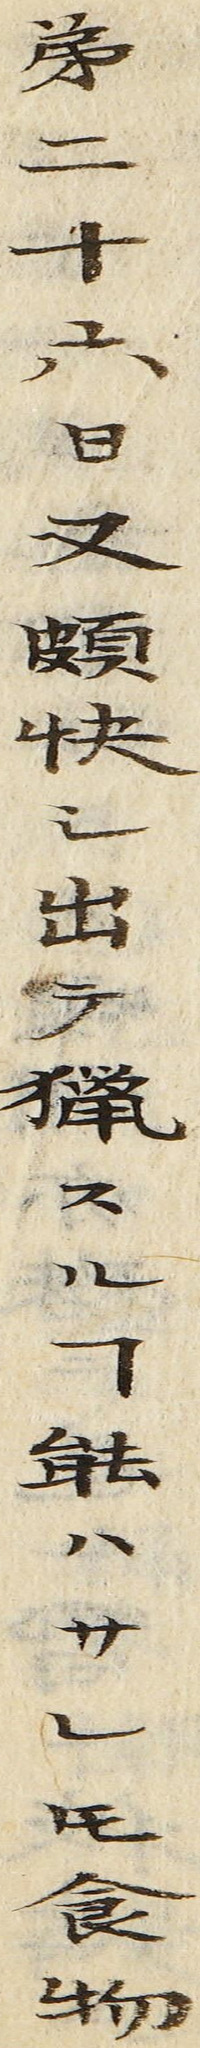第二十六日又頗快シ出テ猟スルコト能ハサレトモ食物
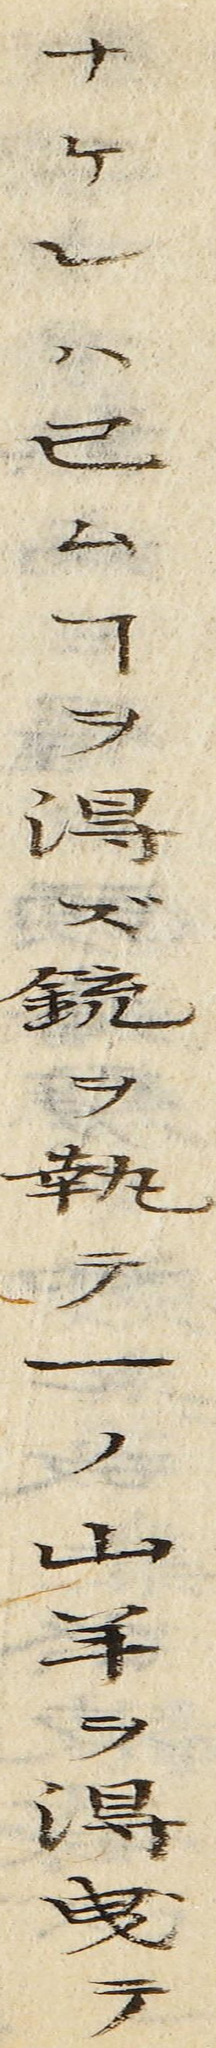ナケレハ已ムコトヲ得ズ銃ヲ執テ一ノ山羊ヲ得曳テ
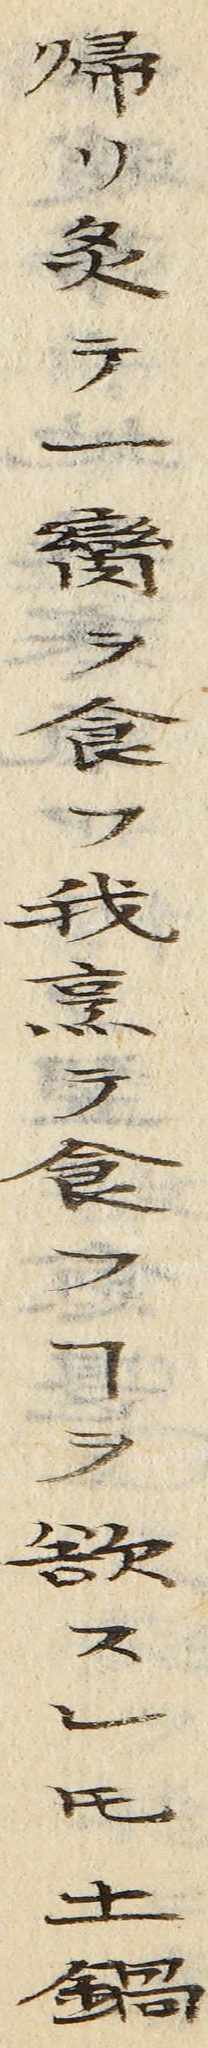帰リ炙テ一臠ヲ食フ我烹テ食フコトヲ欲スレトモ土鍋
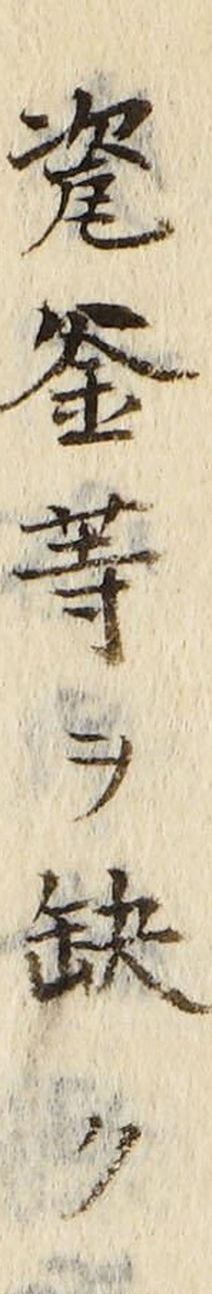瓷釜等ヲ欠ク
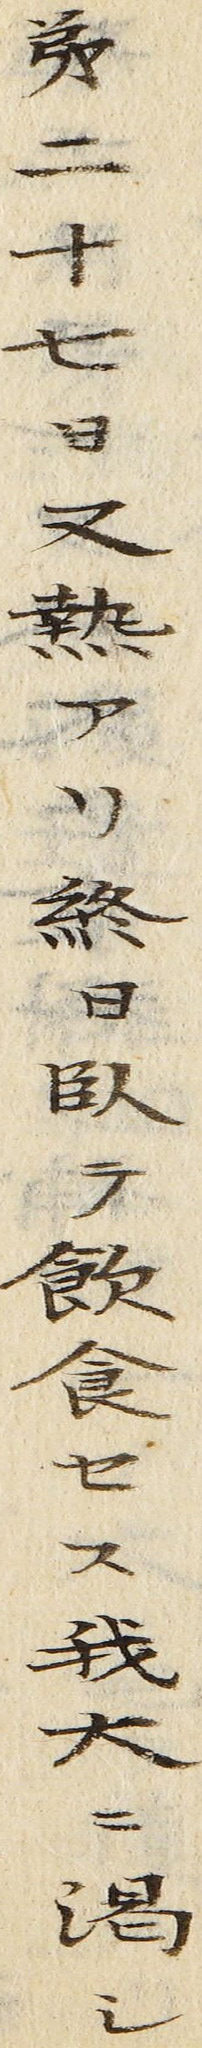第二十七日又熱アリ終日臥テ飲食セス我大ニ渇シ
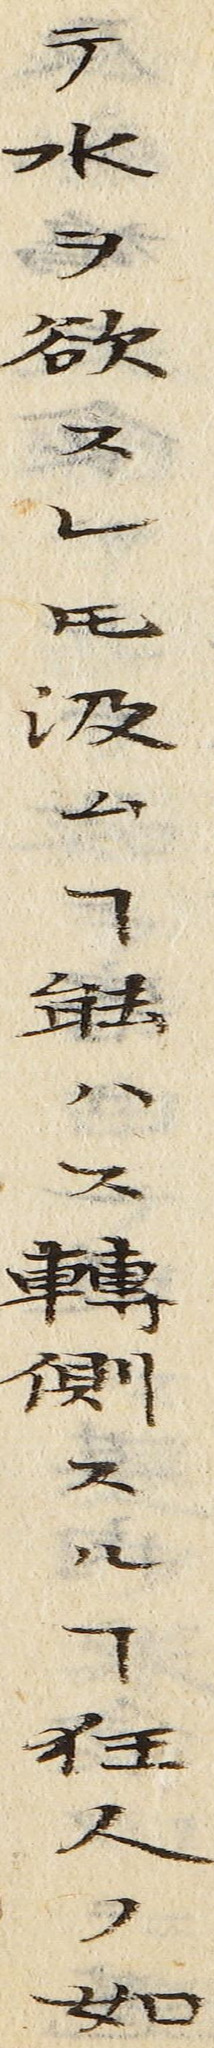テ水ヲ欲スレトモ汲ムコト能ハス転側スルコト狂人ノ如
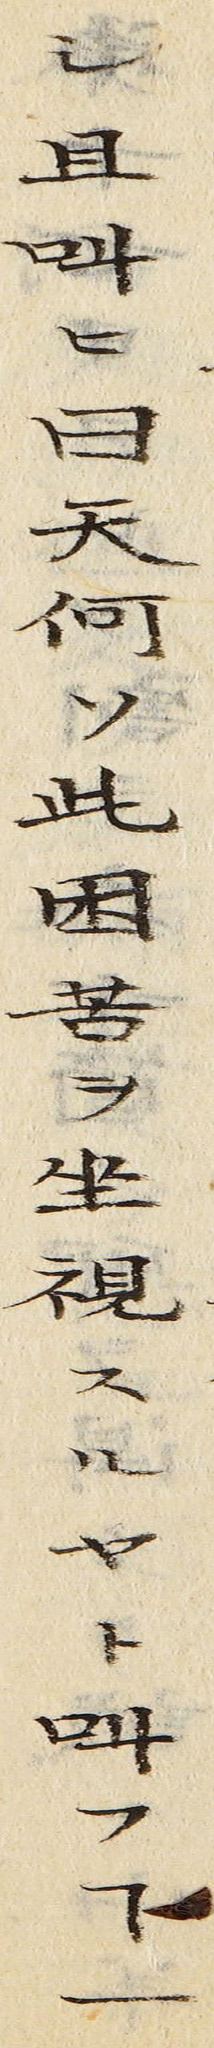シ且叫ヒ曰天何ソ此困苦ヲ坐視スルヤト叫フコト一
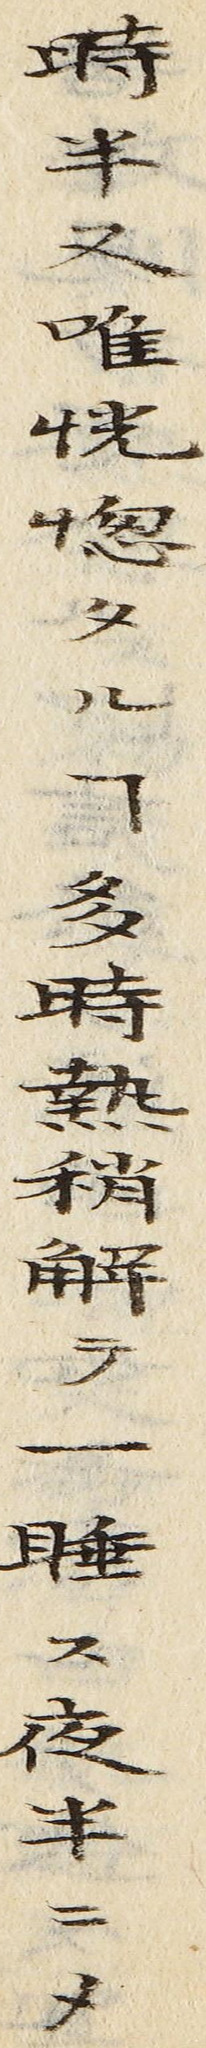時半又唯恍惚タルコト多時熱稍解テ一睡ス夜半ニシテ
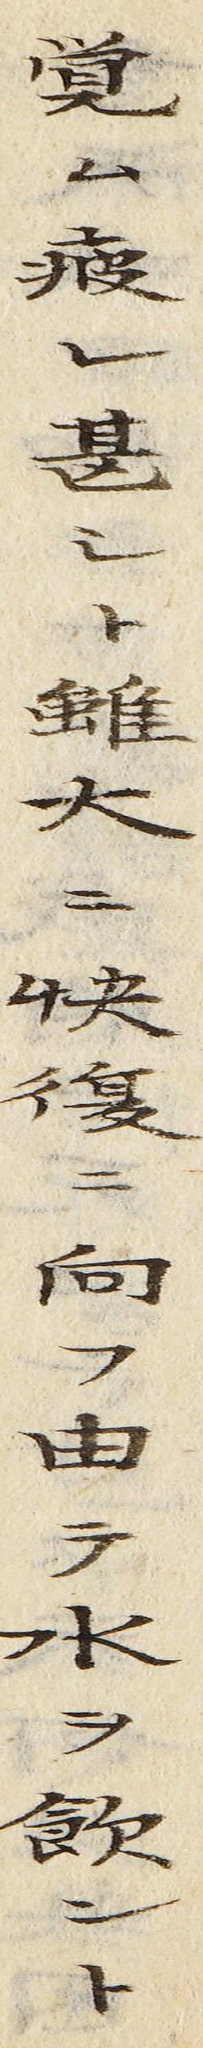覚ム疲レ甚シト雖大ニ快復ニ向フ由テ水ヲ飲ント
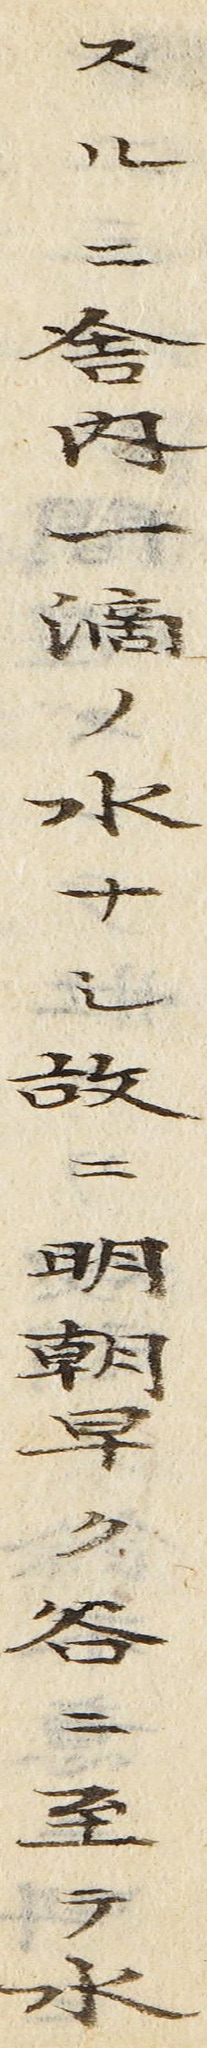スルニ舎内一滴ノ水ナシ故ニ明朝早ク谷ニ至テ水
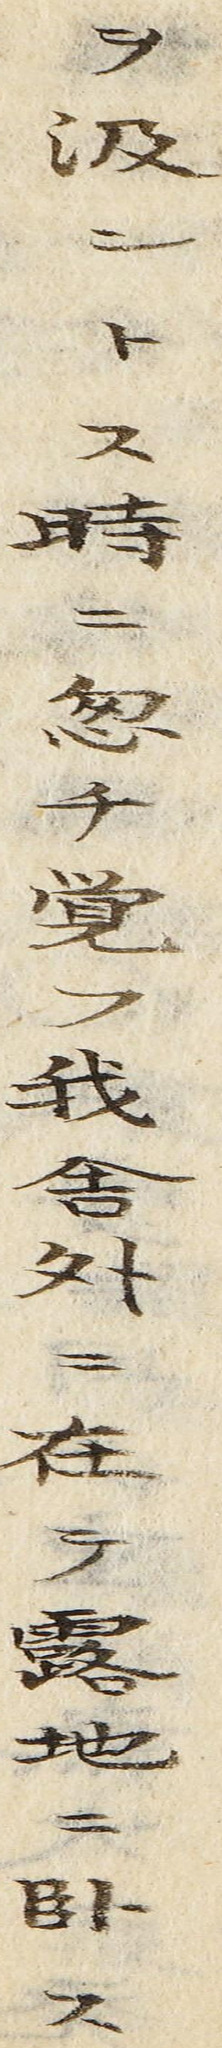ヲ汲ントス時ニ忽チ覚フ我舎外ニ在テ露地ニ臥ス
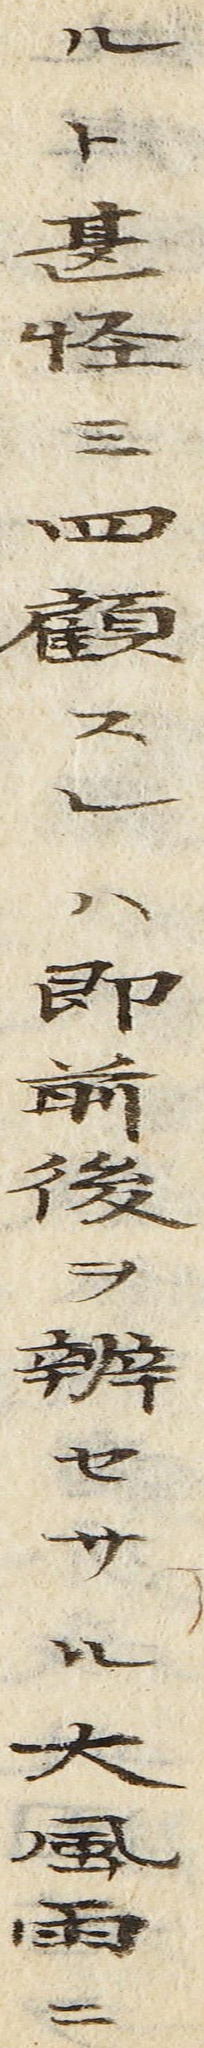ルト甚怪ミ四顧スレハ即前後ヲ弁セサル大風雨ニ
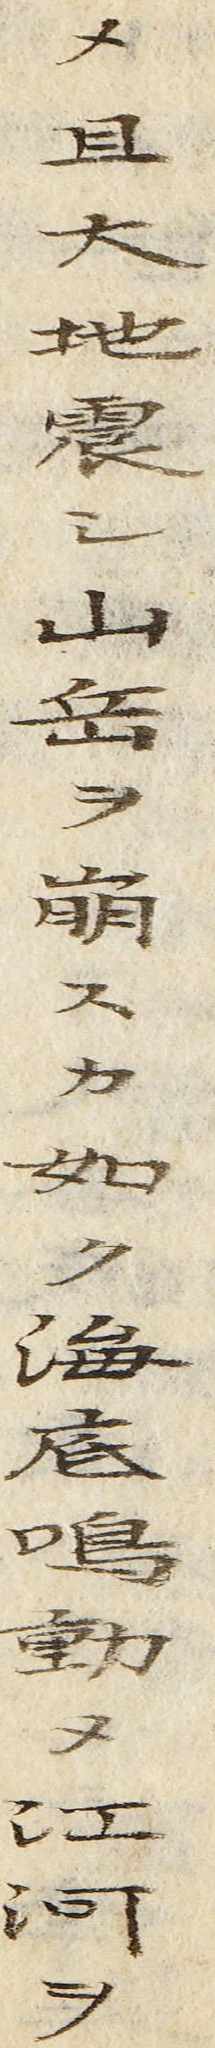シテ且大地震シ山岳ヲ崩スカ如ク海底鳴動シテ江河ヲ
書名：漂流紀事
